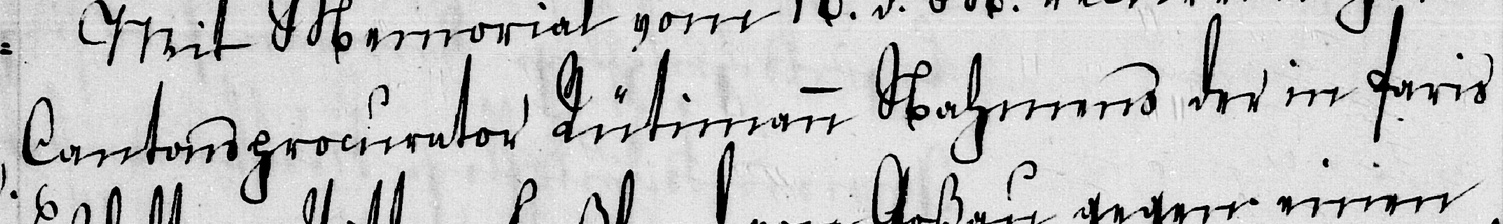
Cantonsprocurator Rütimann Nahmens der in Paris
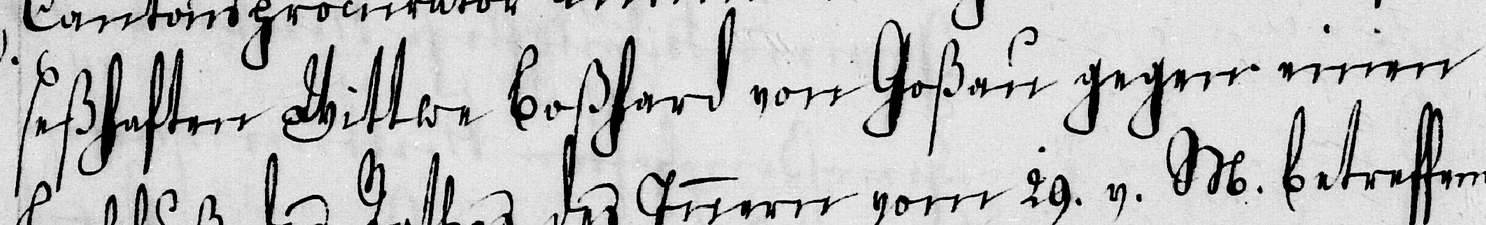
seßhaften Wittwe Boßhard von Goßau gegen einen
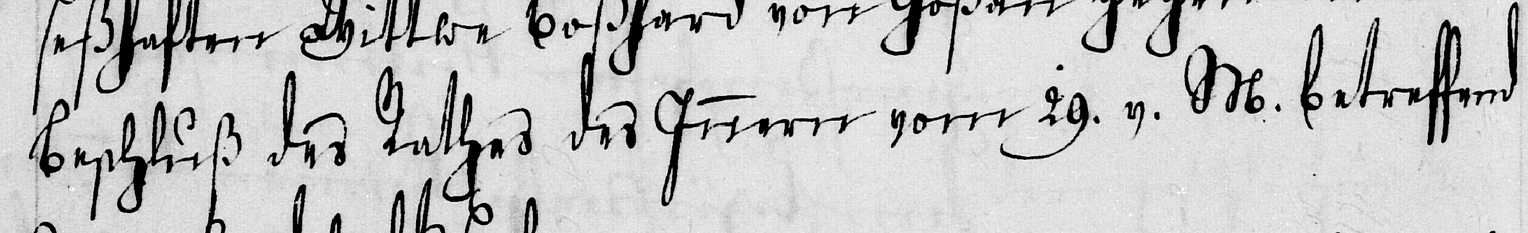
Beschluß des Rathes des Innern vom 29. v. M. betreffe¬
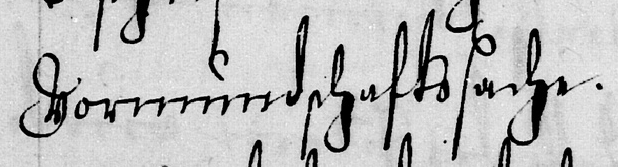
Vormundschaftssache.
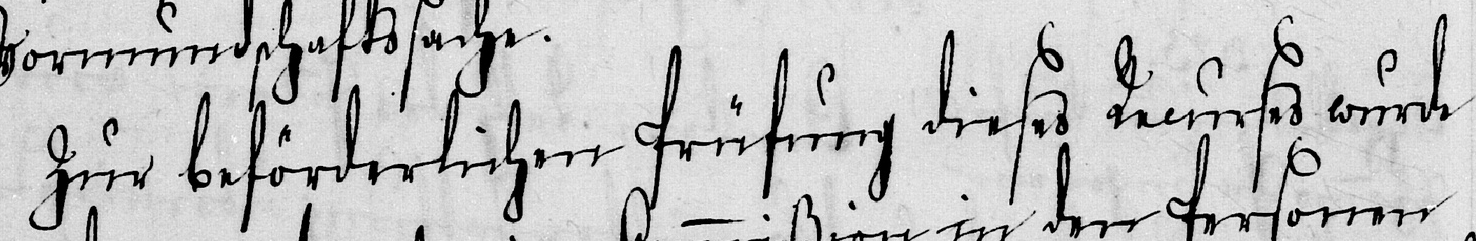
Zur Beförderlichen Prüfung dieses Recurses wur¬
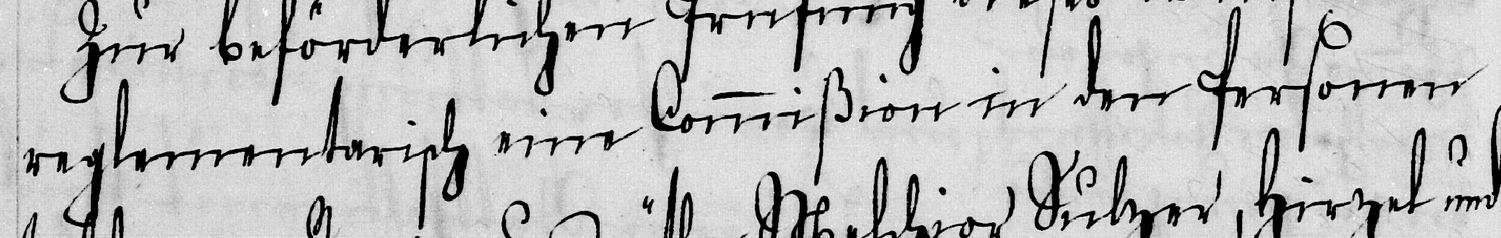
reglementarisch eine Commißion in den Personen
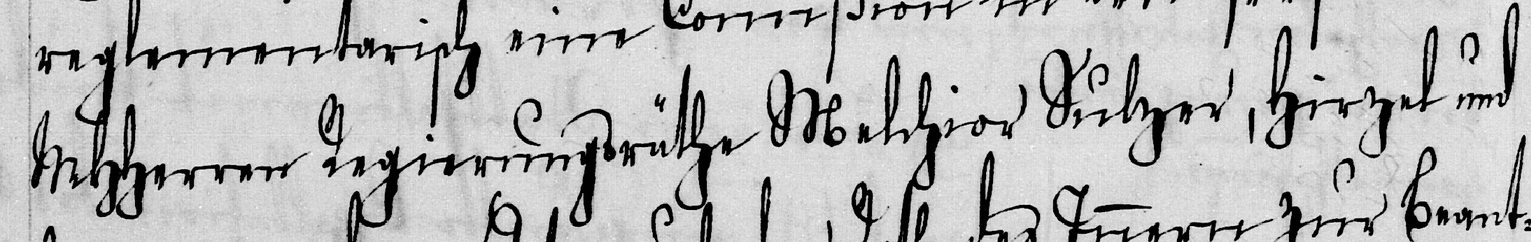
MHHerren Regierungsräthe Melchior Sulzer, Hirzel und
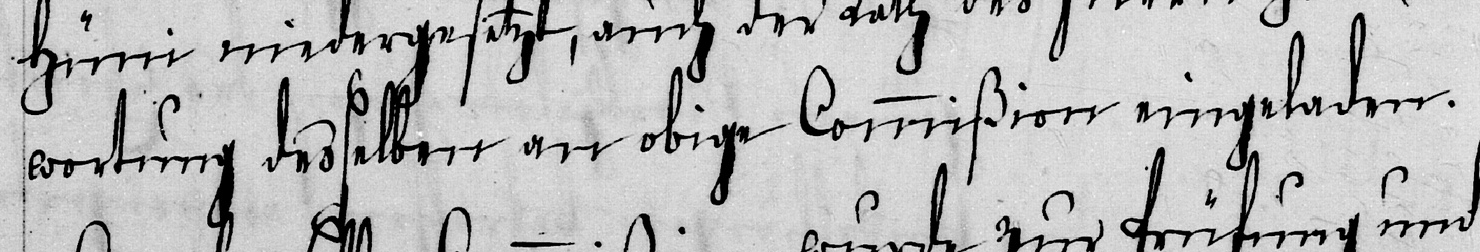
wortung desselben an obige Commißion eingeladen.
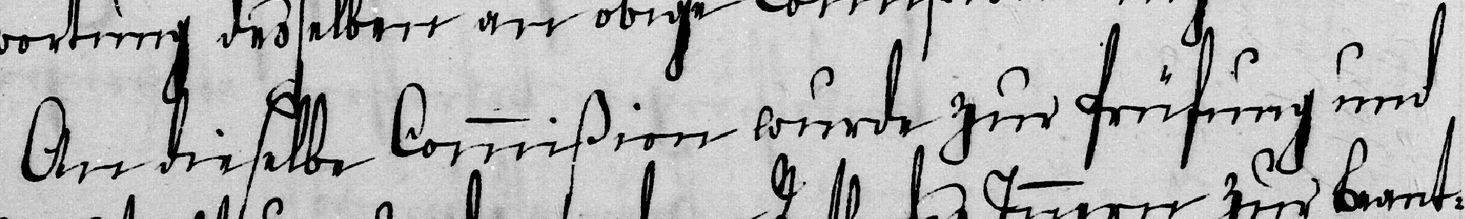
An dieselbe Commißion wurde zur Prüfung und
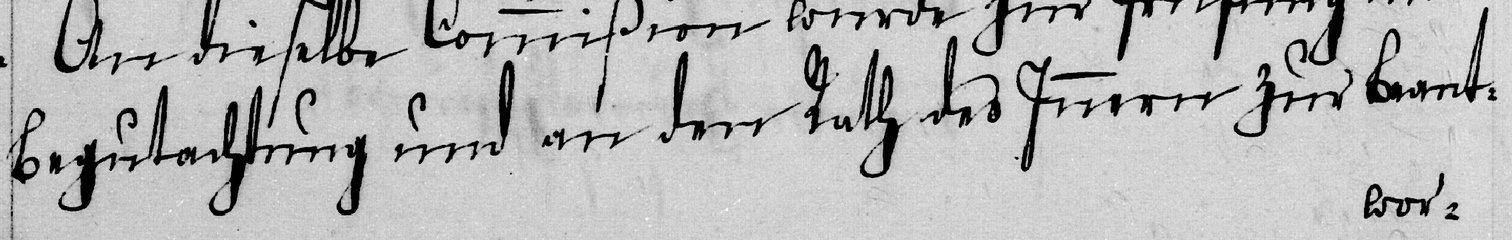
Begutachtung und an den Rath des Innern zur Beant-
